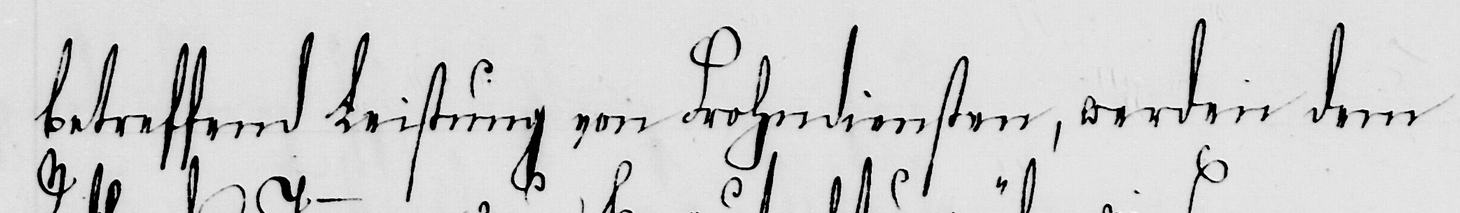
betreffend Leistung von Frohndiensten, werden dem
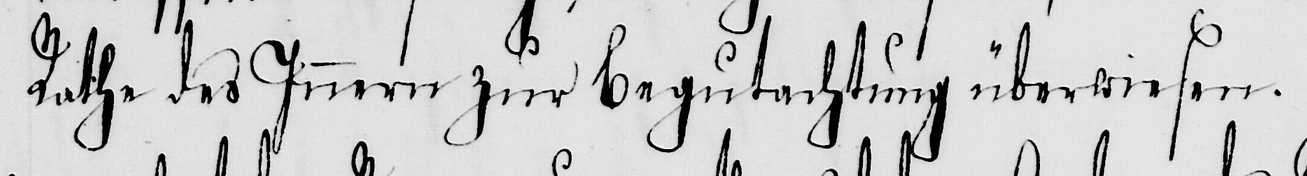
Rathe des Innern zur Begutachtung überwiesen.
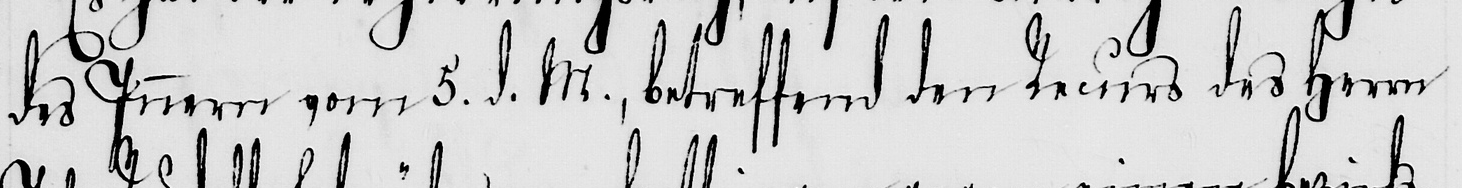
des Innern vom 5. d. M., betreffend den Recurs des Herrn
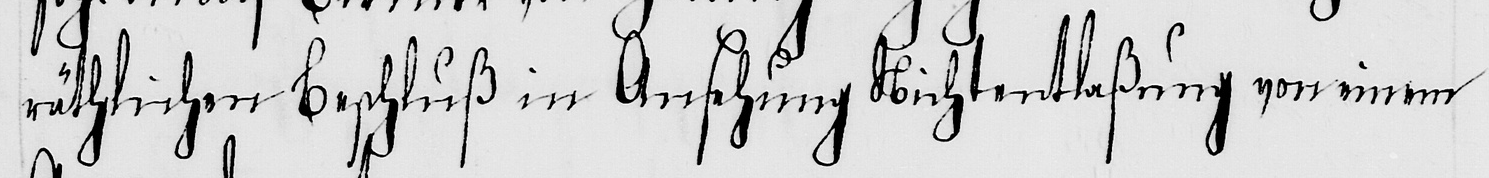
räthlichen Beschluß in Ansehung Nichtentlaßung von einem
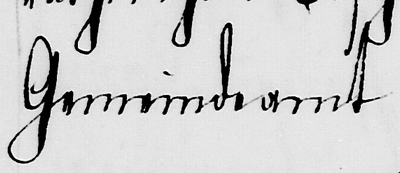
Gemeindeamt
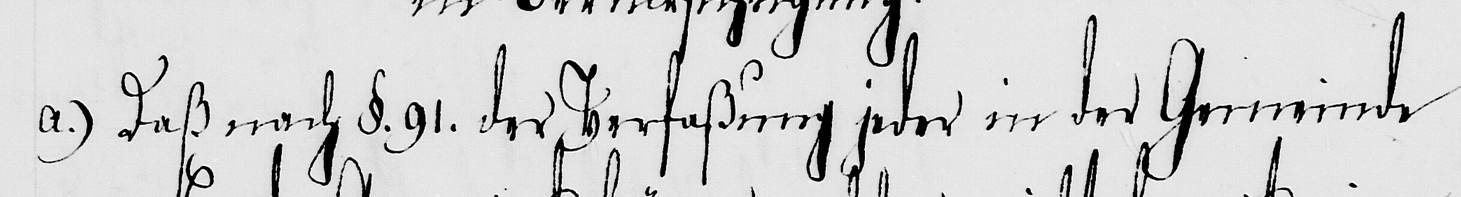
a.) Daß nach §. 91. der Verfaßung jeder in der Gemeinde
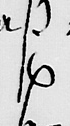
es¬
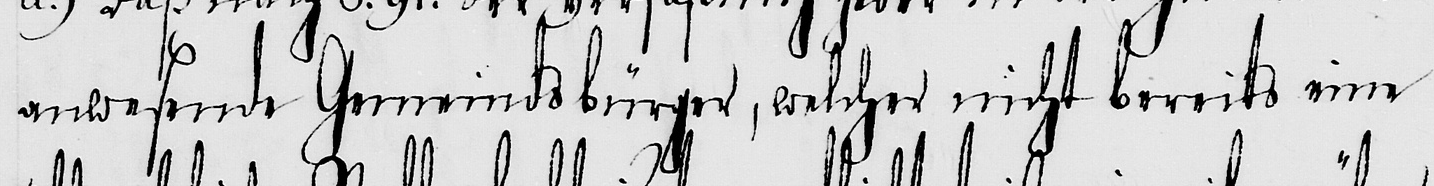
anwesende Gemeindsbürger, welcher nicht bereits eine
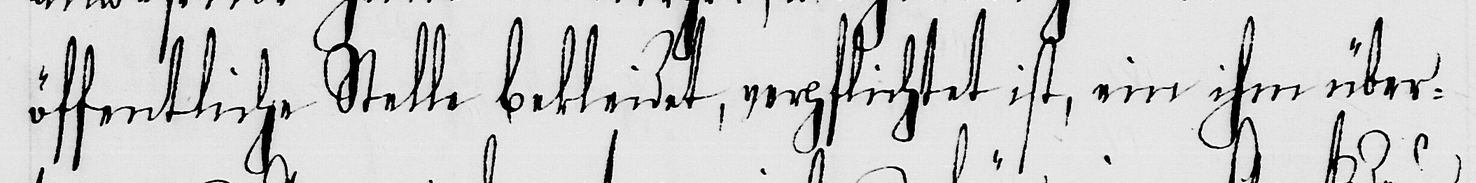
Stelle bekleidet, verpflichtet ist, ein ihm über¬
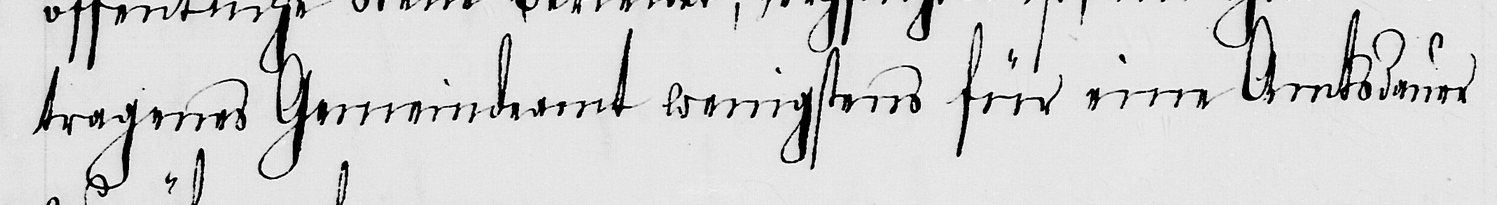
tragenes Gemeindeamt wenigstens für eine Amtsdauer
